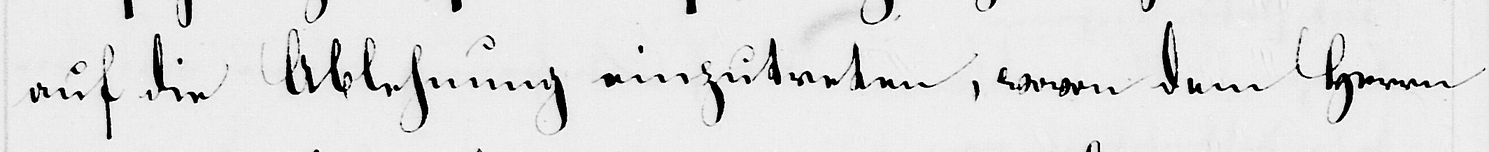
auf die Ablehnung einzutreten, wovon dem Herrn
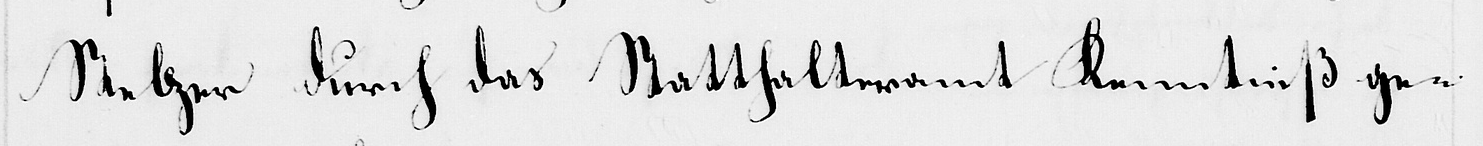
Stelzer durch das Statthalteramt Kenntniß ge¬
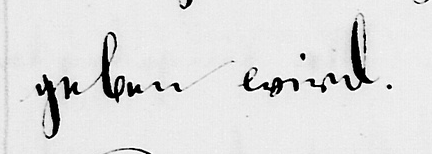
geben wird.
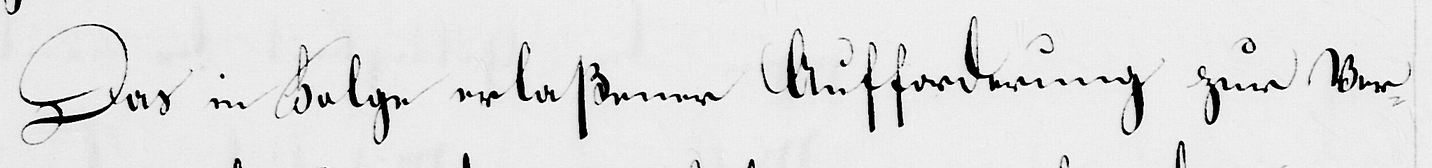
Das in Folge erlaßener Aufforderung zur Ver¬
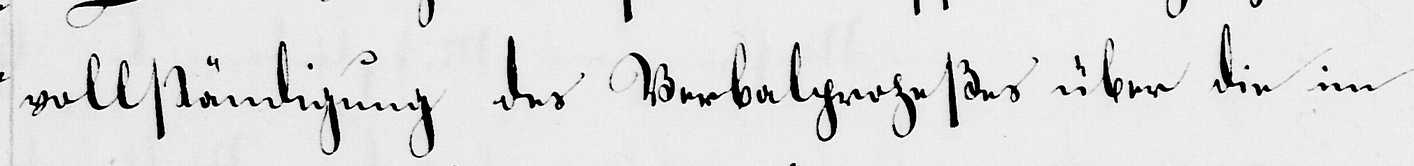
vollständigung des Verbalprozeßes über die im
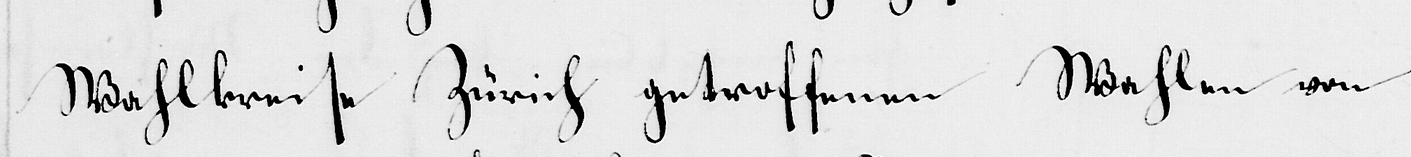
Wahlkreise Zürich getroffenen Wahlen von
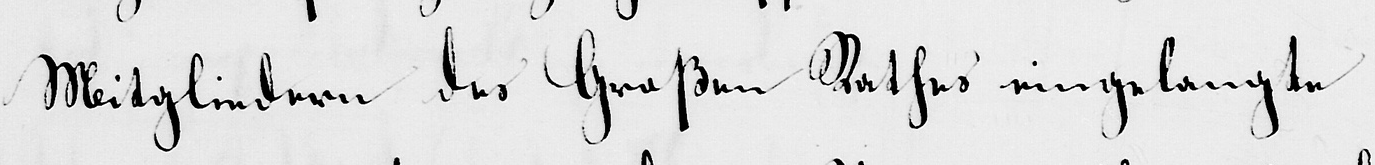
Mitgliedern des Großen Rathes eingelangte
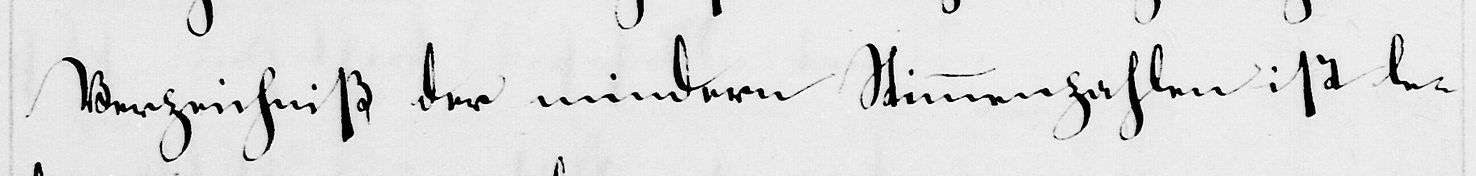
Verzeichniß der mindern Stimmenzahlen ist le¬
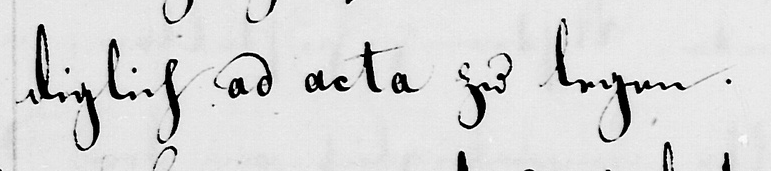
diglich ad acta zu legen.
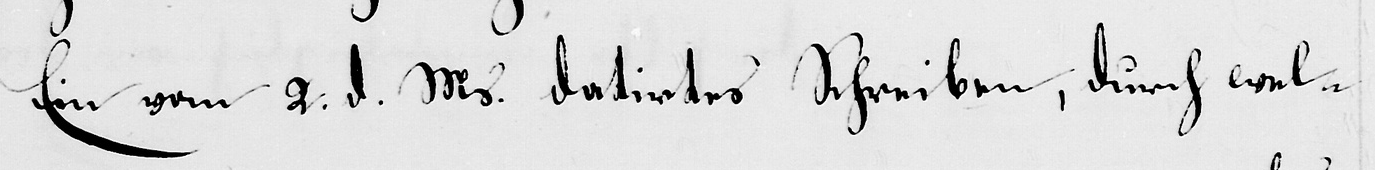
Ein vom 2. d. Ms. datirtes Schreiben, durch wel-
